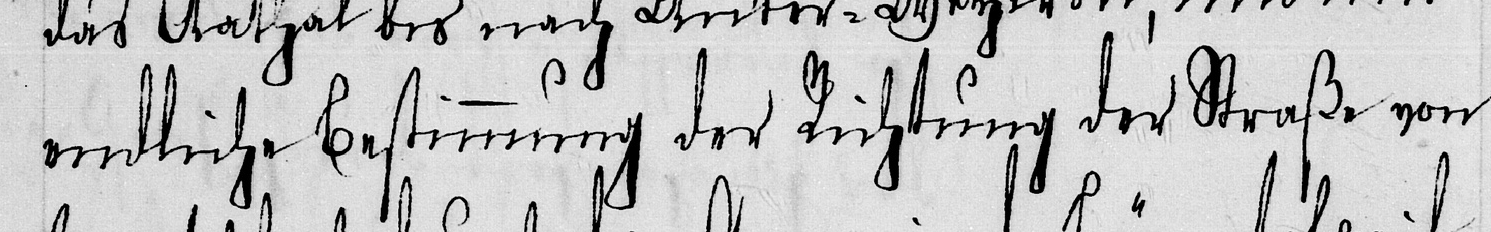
endliche Bestimmung der Richtung der Straße von
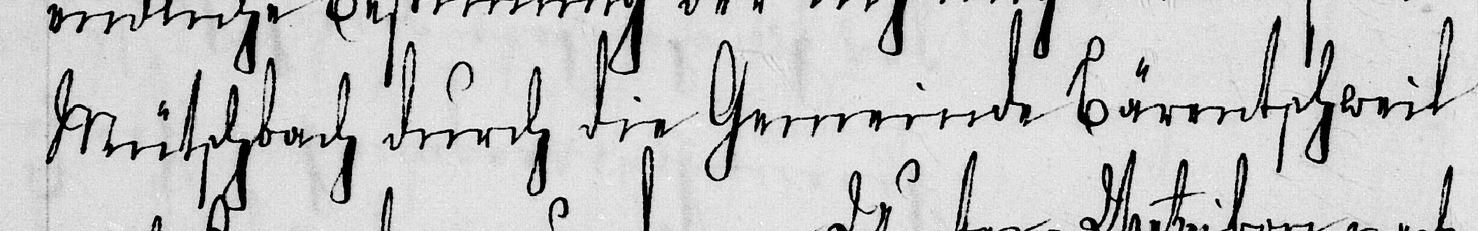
Mütschbach durch die Gemeinde Bärentschweil
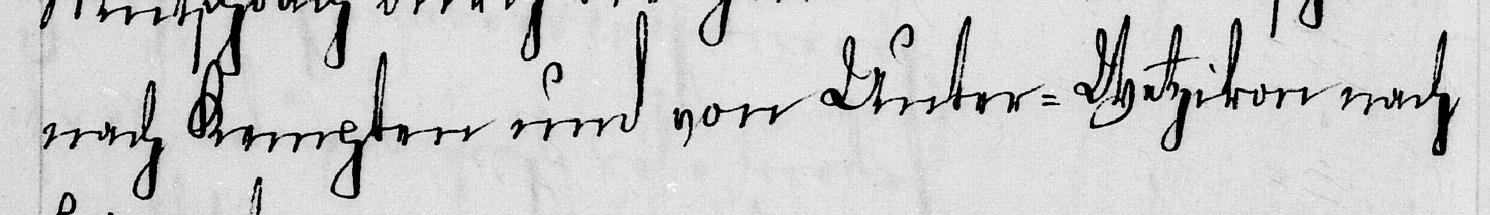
nach Kempten und von Unter-Wetzikon nach
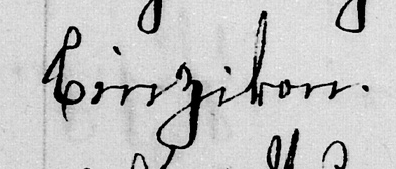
Binzikon.
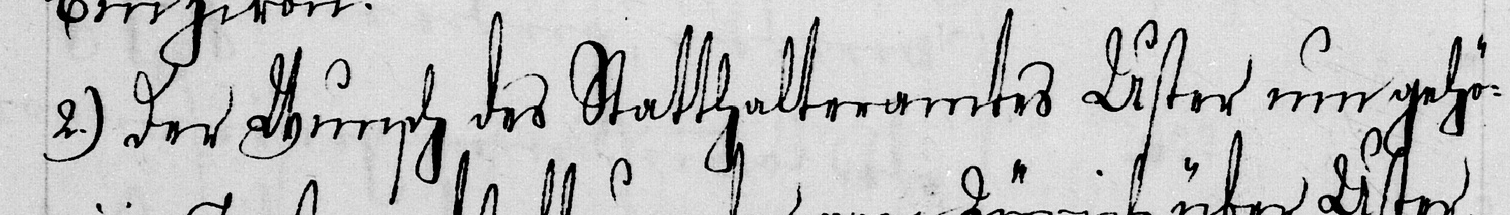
2.) Der Wunsch des Statthalteramtes Uster um gehö¬
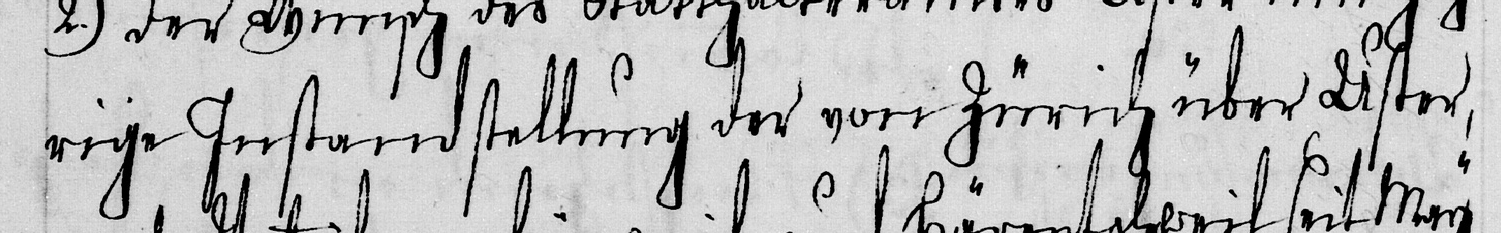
rige Instandstellung der von Zürich über Uster,
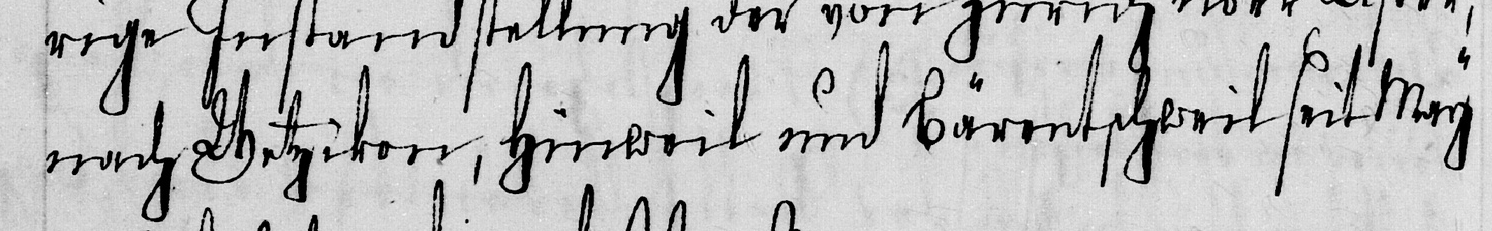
nach Wetzikon, Hinweil, und Bärentschweil seit
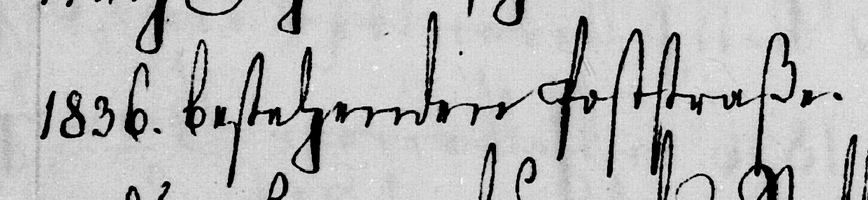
1836. bestehenden Postsstraße.
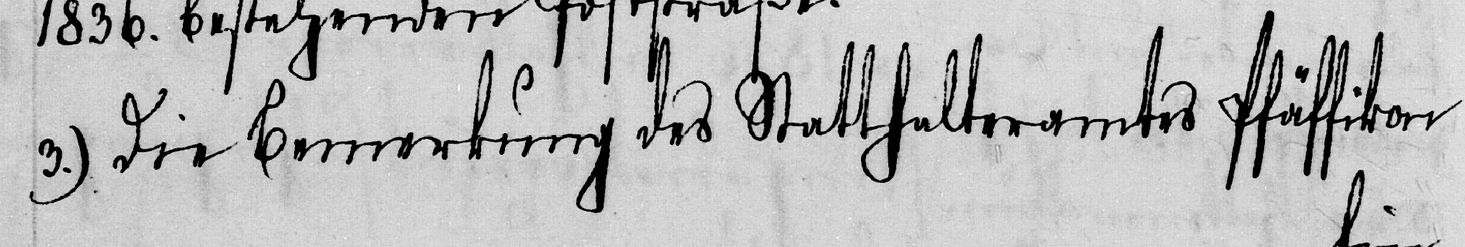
3.) Die Bemerkung des Statthalteramtes Pfäffikon
